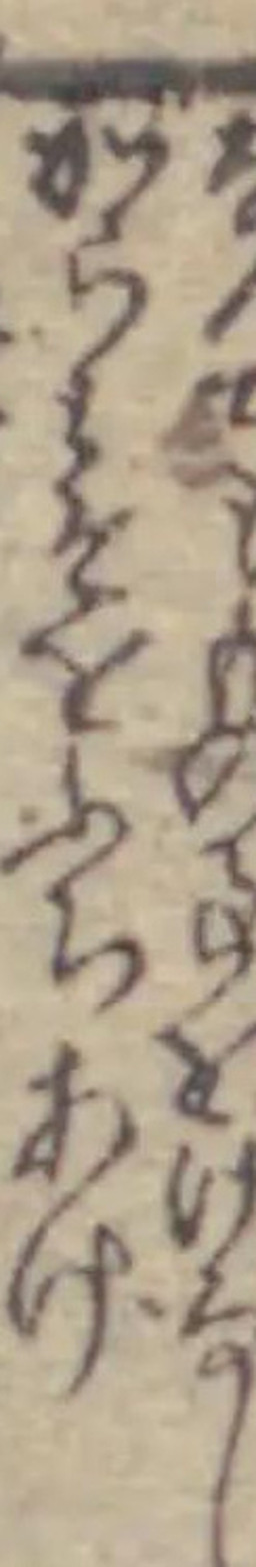からみそをふちあけ
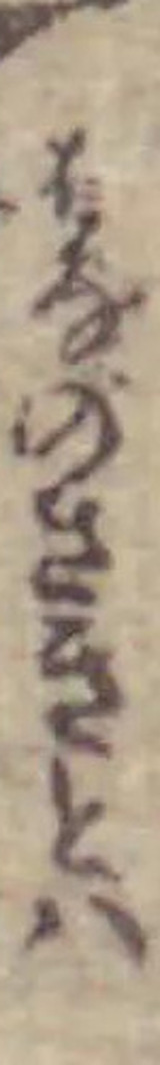はなのさきとは
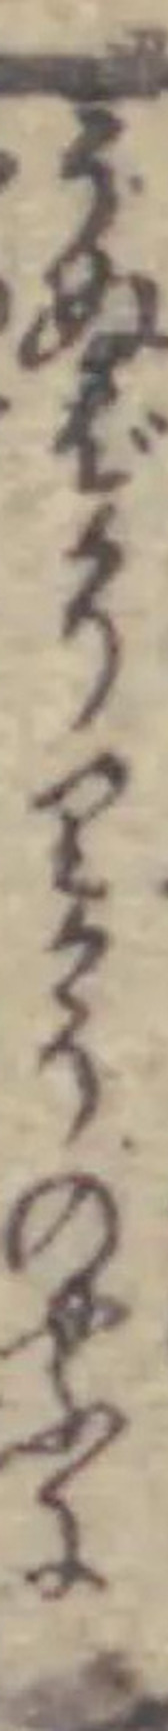うぬばかりりかうのやふに
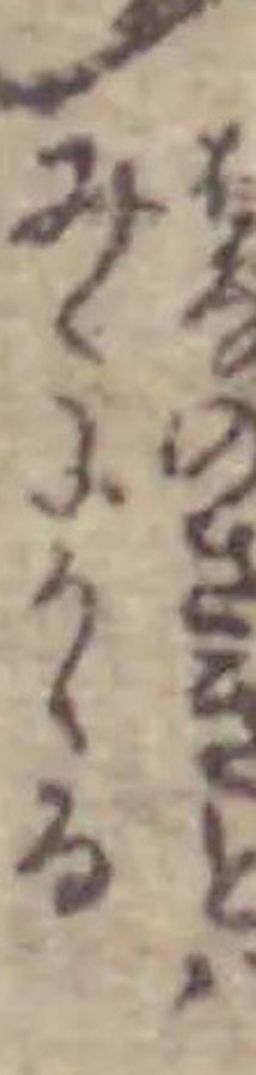みゝにかゝる
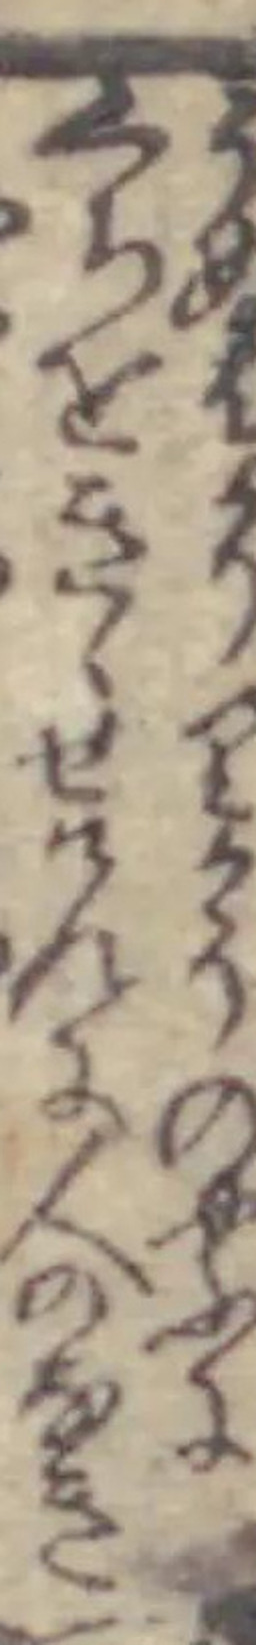くちをきゝせけんに人のなき
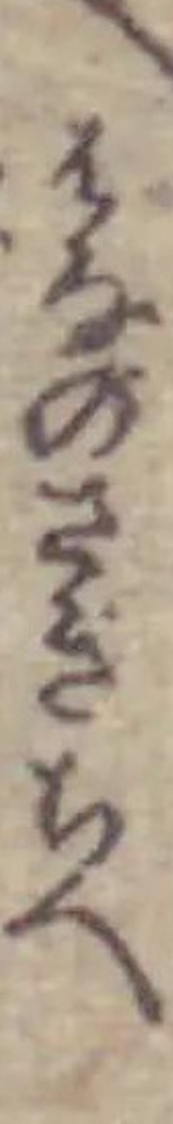はなのさきちへ
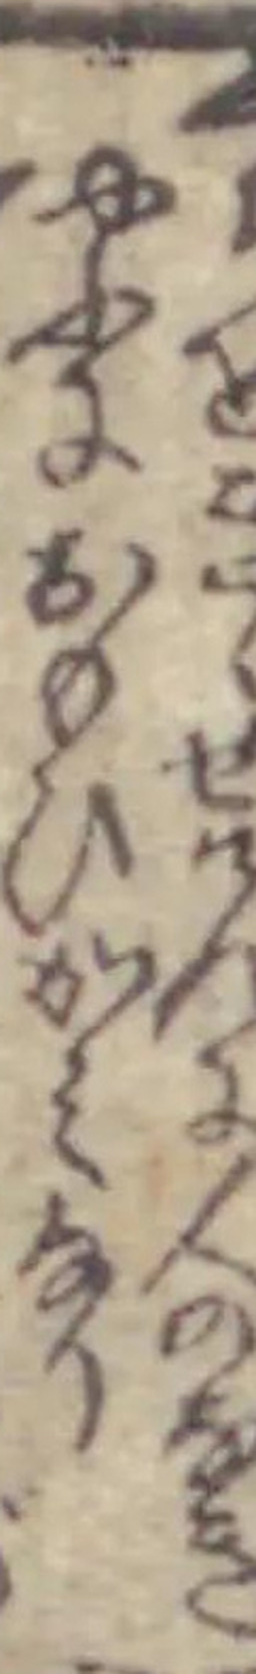やふにおもひかみなり
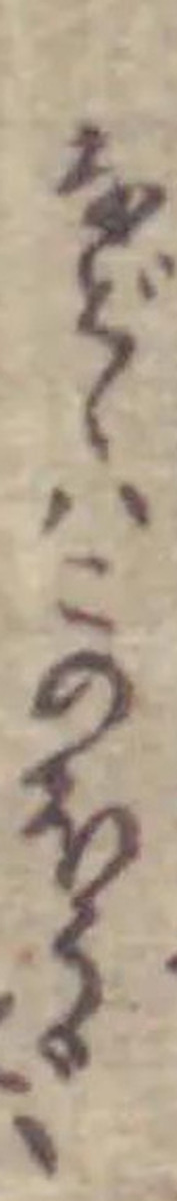などゝはこのほうでは
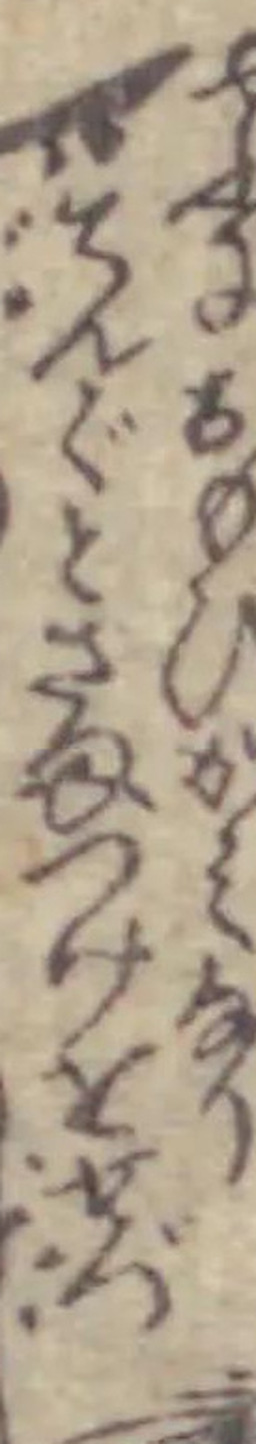てんぐとさまつけをせづ
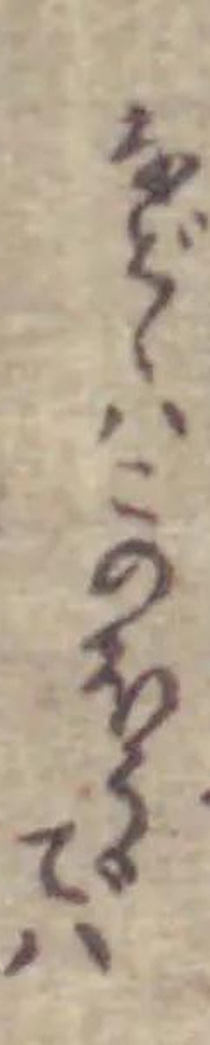などゝはこのほうでは
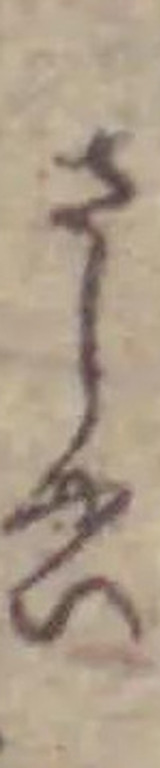さしやい
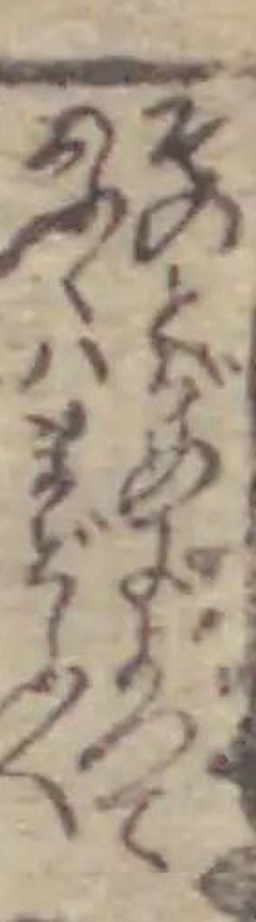おふくはまどふへ
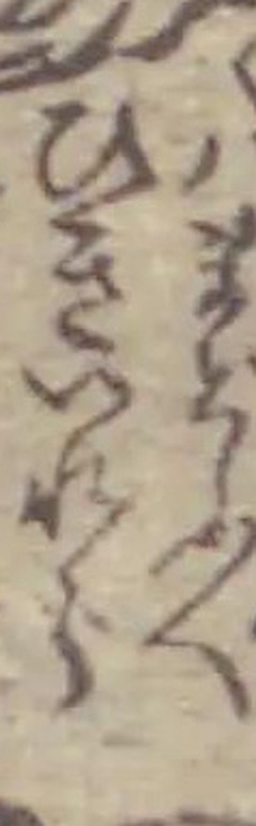ひきいれら

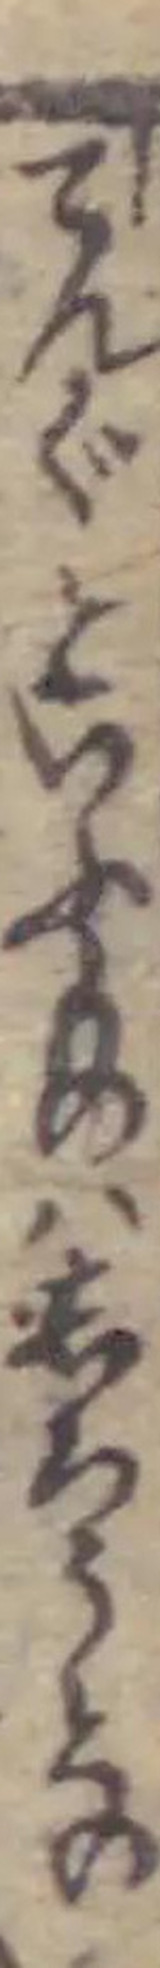てんぐといふものはしちうとの
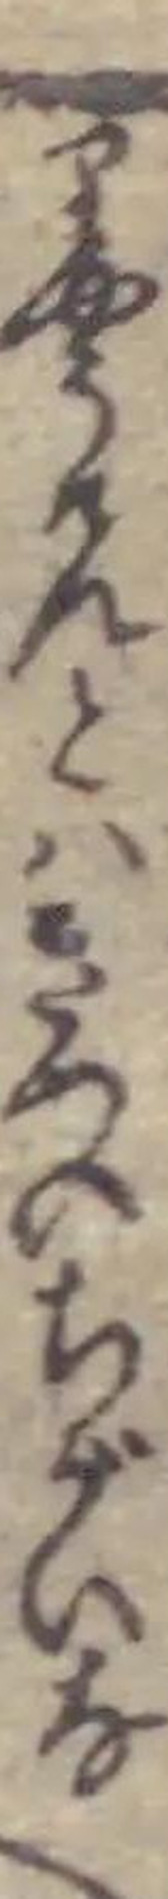りやうけんとはきついちかいな
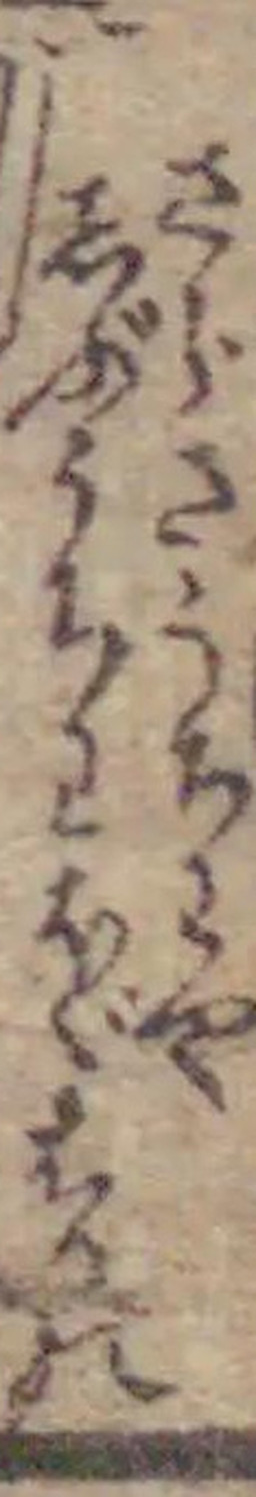しぶうちわほぐはりの
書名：珍説女天狗 2巻
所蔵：国立国会図書館 National Diet Library, JAPAN
